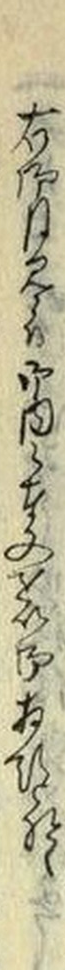右御目見ニ付御内々奉文を以御拝領被遊候
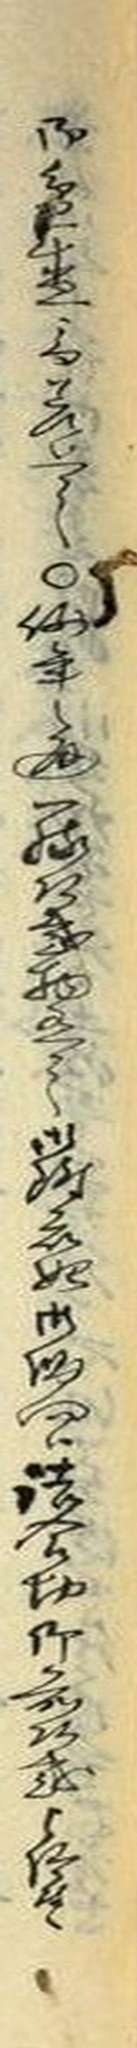御盆盛ニ而差上之〇例年之通一統頂戴物有之御附衆始御側向ハ詰合切御前頂戴被仰付候
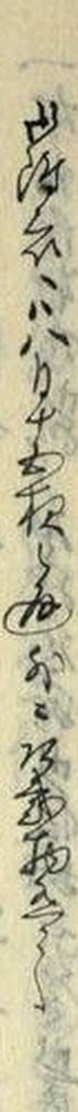御附衆へハ八月十五夜之通外ニ頂戴物有之
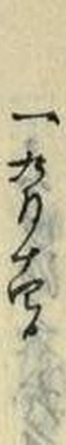一九月十二日
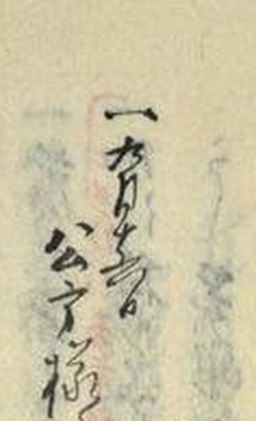一九月十六日
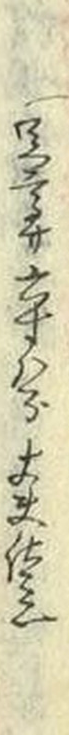足高サ六寸八分丈夫仕立
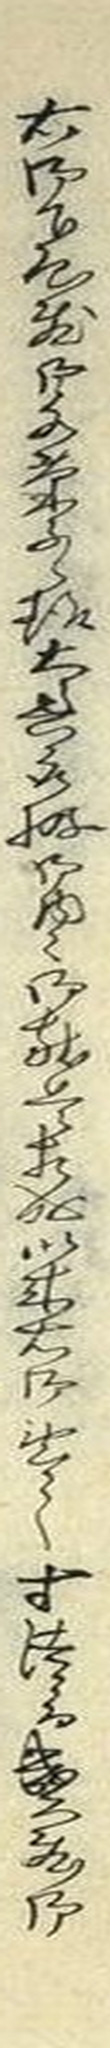右御下屋敷御水菓子之趣大奥取扱御内々御献上ニ相成以来右御台之寸法ニ而幾久敷御
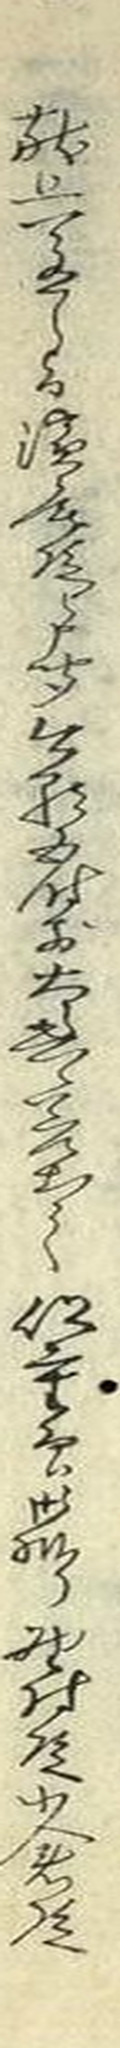献上可有之旨浜尾殿被申聞今朝五時前大奥へ差出之但重而ハ御掛り野村殿小
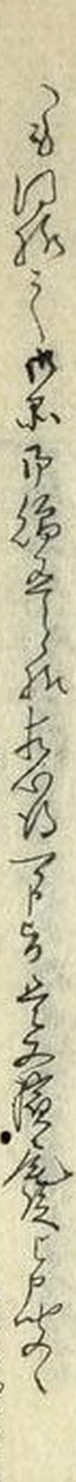へも同様之御品御贈有之候様相心得可申旨是又浜尾殿被申聞候
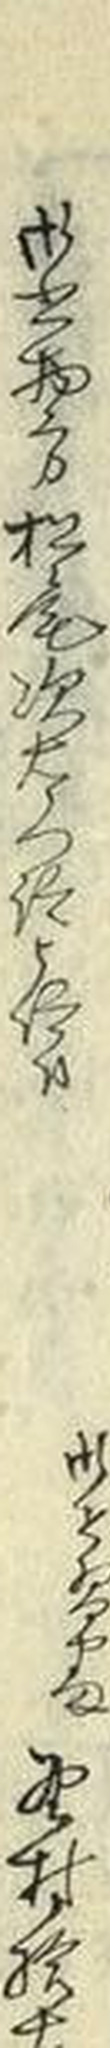御書物方松尾次右衛門跡被仰付御近習番野村拾太夫
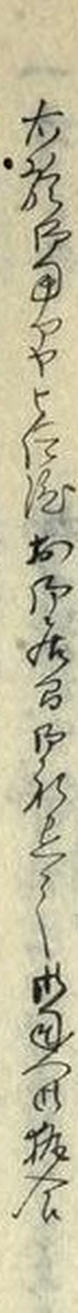右於御用部屋被仰渡於御居間御礼申上之御用人御執合
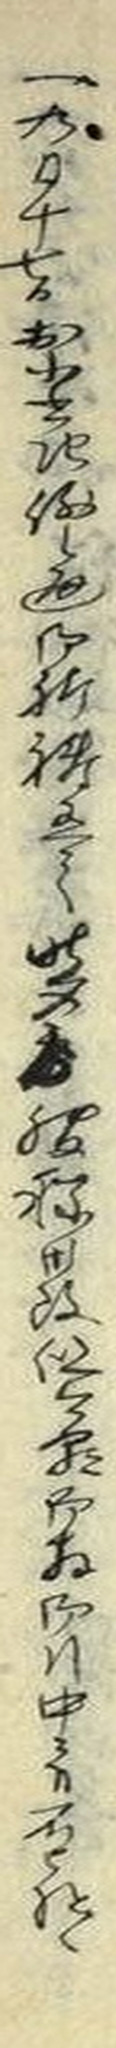一九月十七日於小書院例之通御祈祷有之昨夕服穢御改但今朝御拝御引中ニ付不被遊候

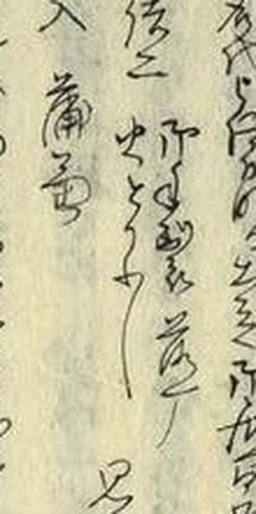火とりふし
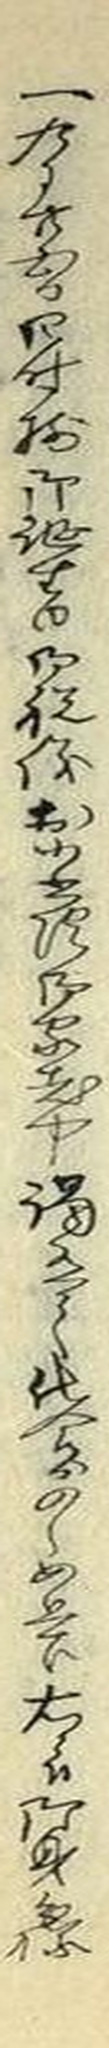一九月廿五日四時揃御誕生日御祝儀尾於小書院御家老中謁有之代合ゟのしめ上下右ニ付御見分様
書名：少傅日録抄（斉善付側向頭取日記、在府）
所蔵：福井県文書館 Fukui Prefectural Archives
